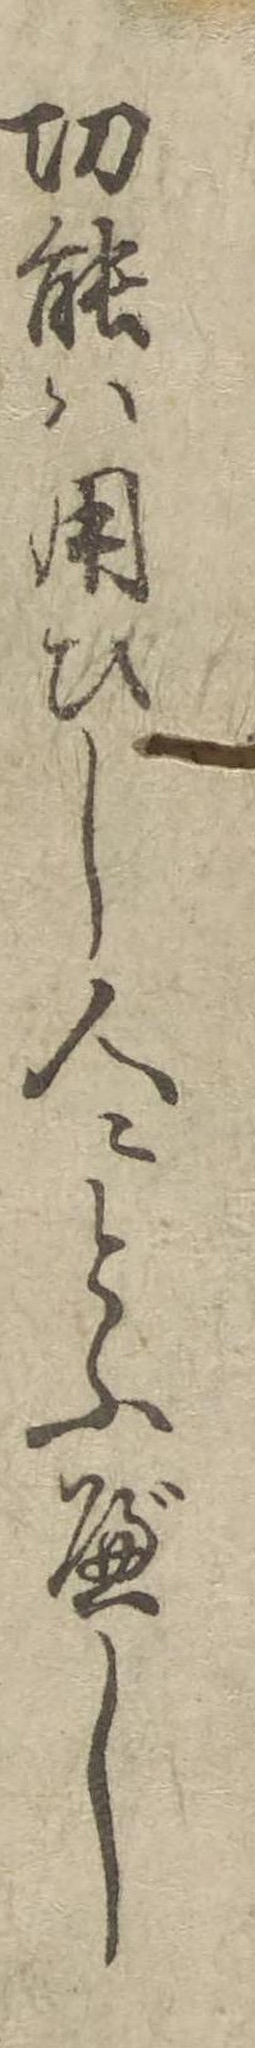功能は用ひし人にとふべし
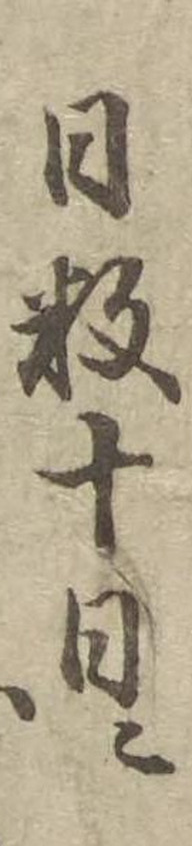日数十日に
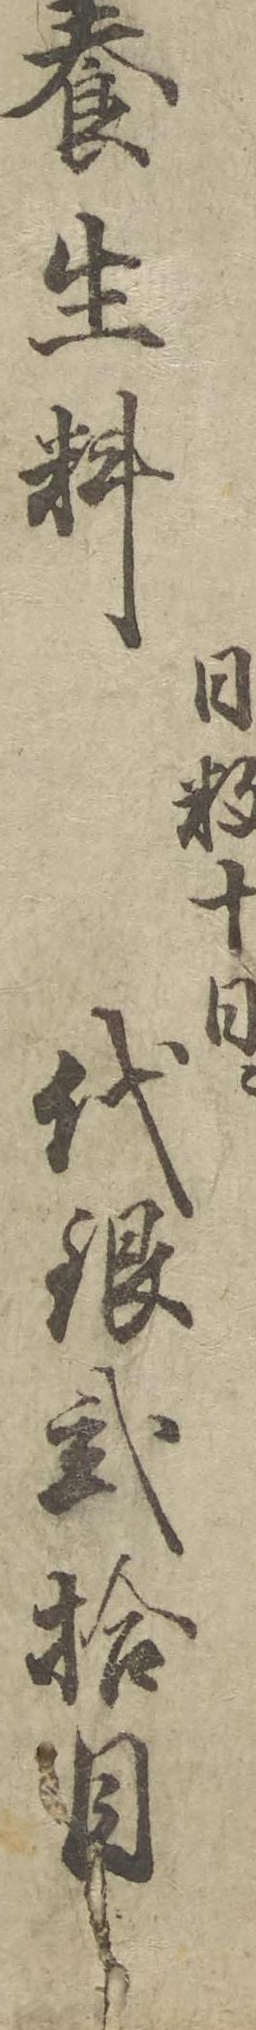養生料代銀弐拾目

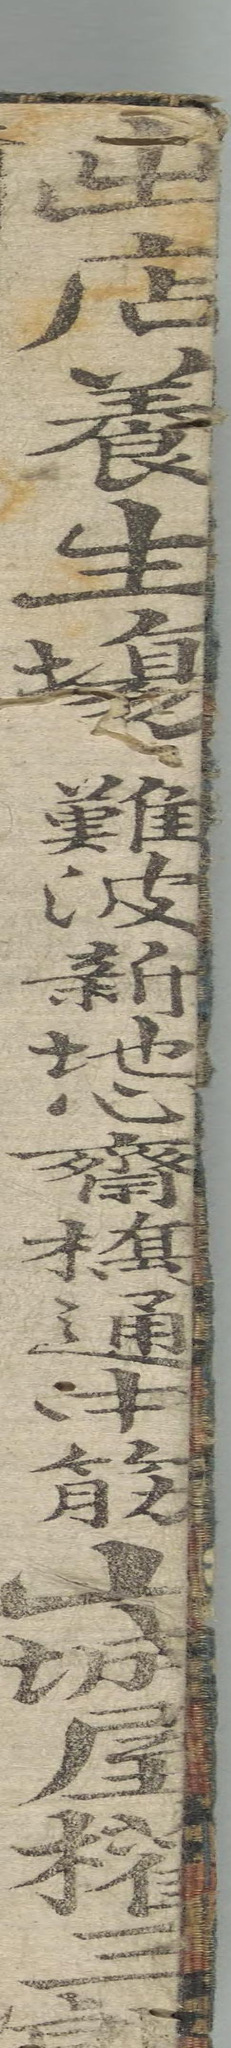出店養生場難波新地心斎橋通中筋山城屋権三郎
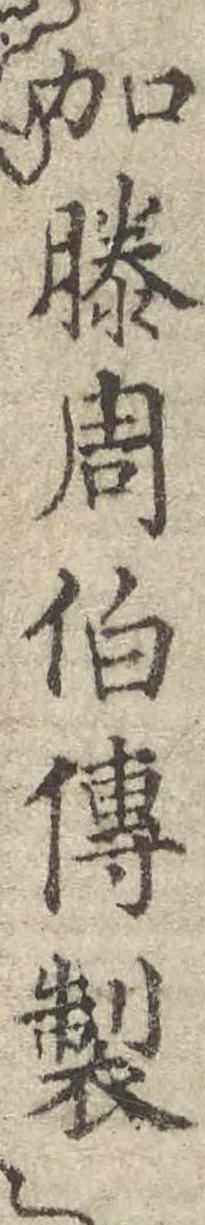加藤周伯伝製
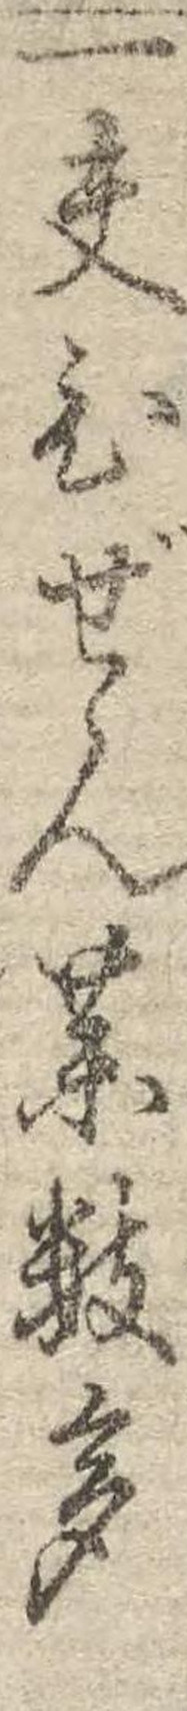一夫ひぜん薬数多
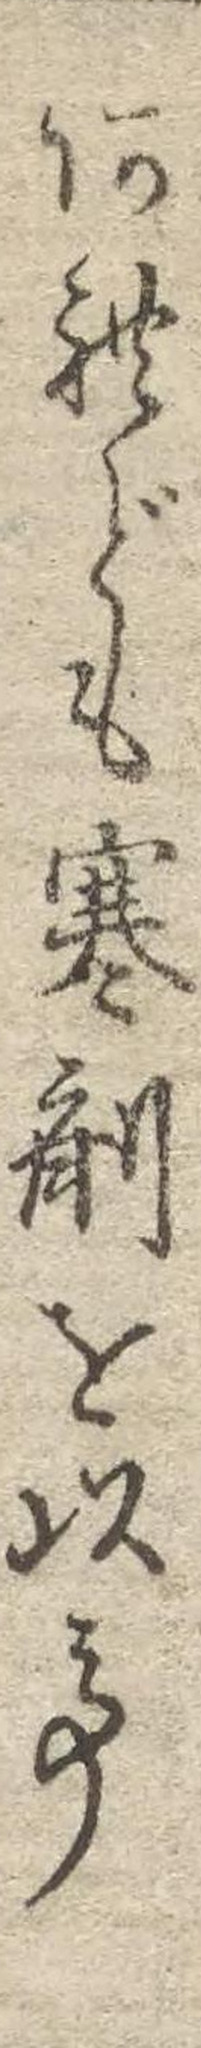あれども寒剤を以て
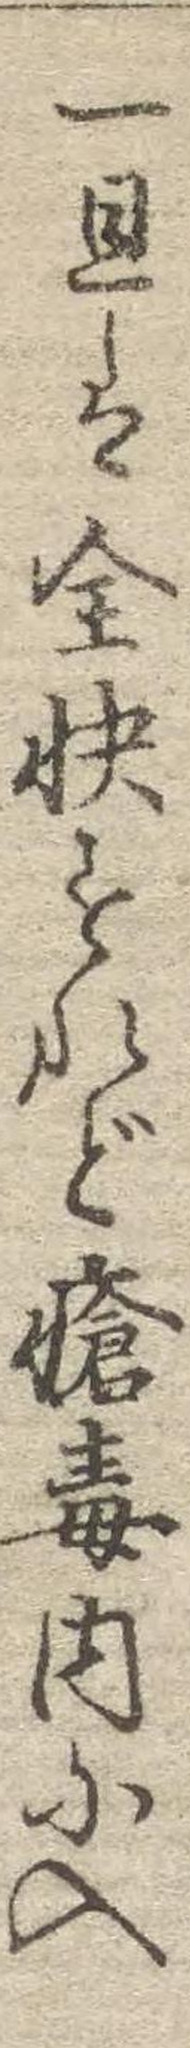一旦は全快すれど瘡毒内に入
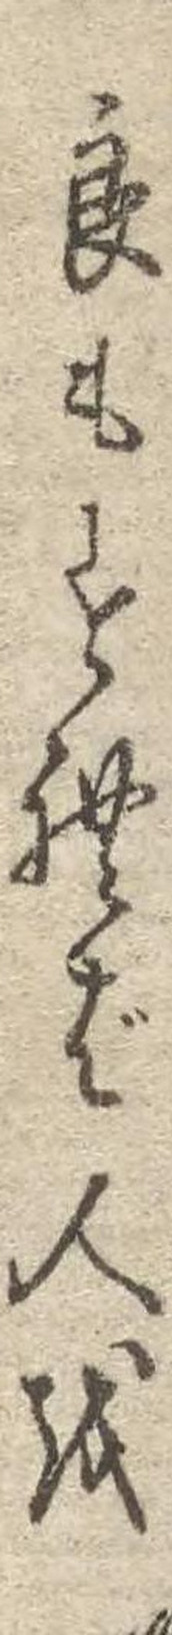良もすれば人を
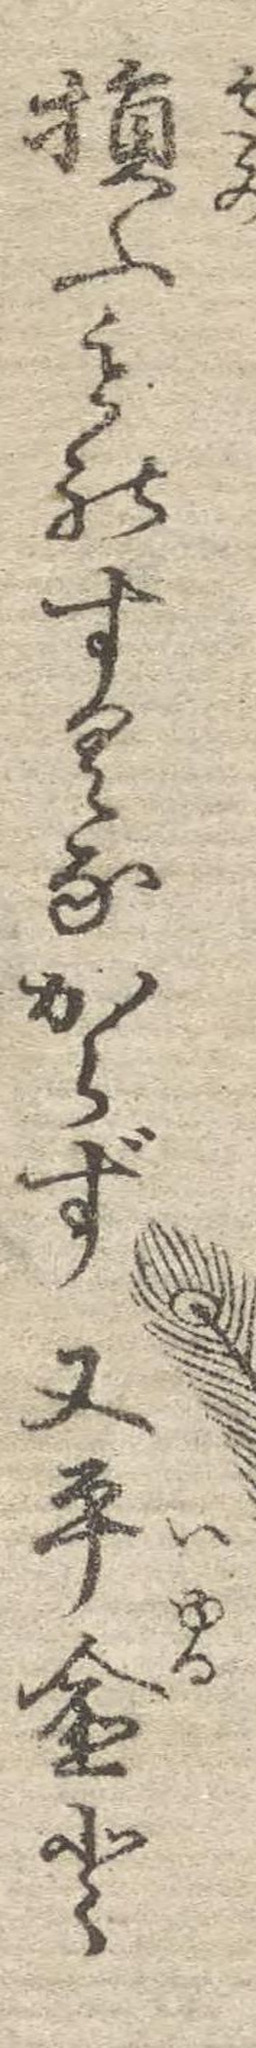損ふものすくなからず又平愈と
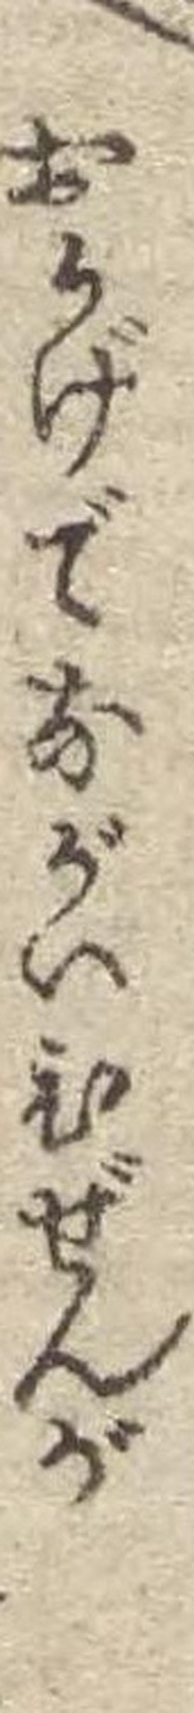おかげでながいひぜんが
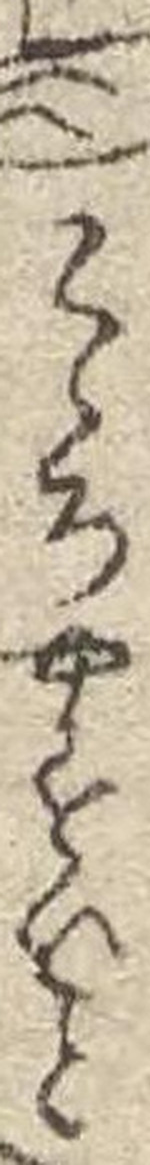こゝろやすいこと
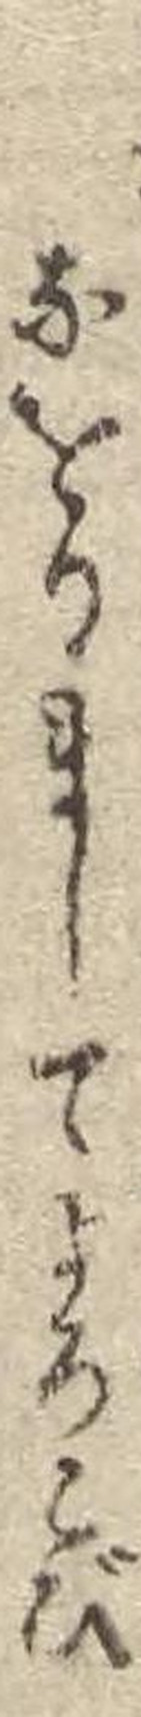なをりましてよろこび
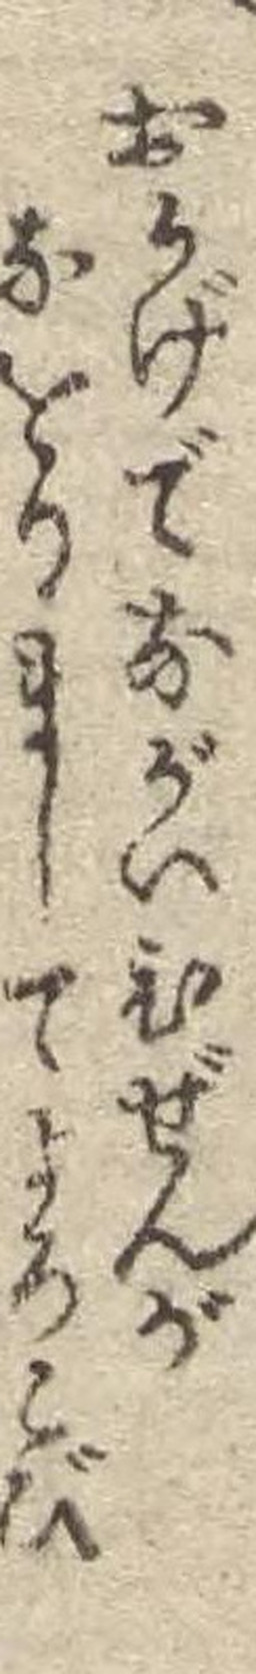なをりましてよろこび
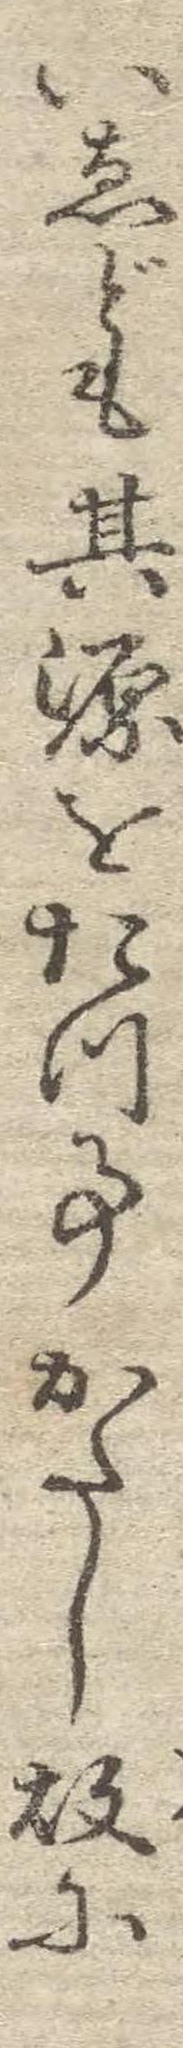いゑども其源をたつ事かたし故に
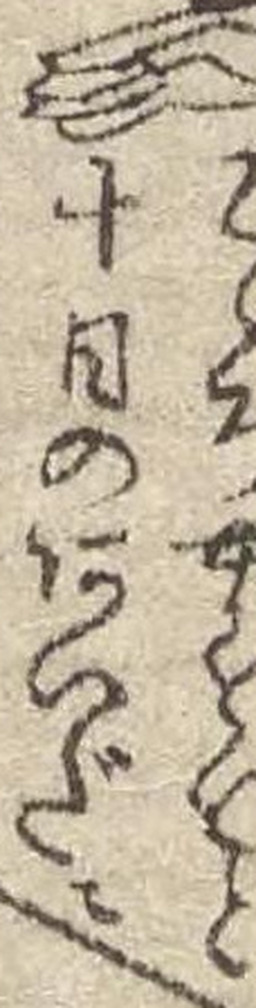十日のあいだに
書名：浪華薬種問屋能書張交帖. 一
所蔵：国立国会図書館 National Diet Library, JAPAN
